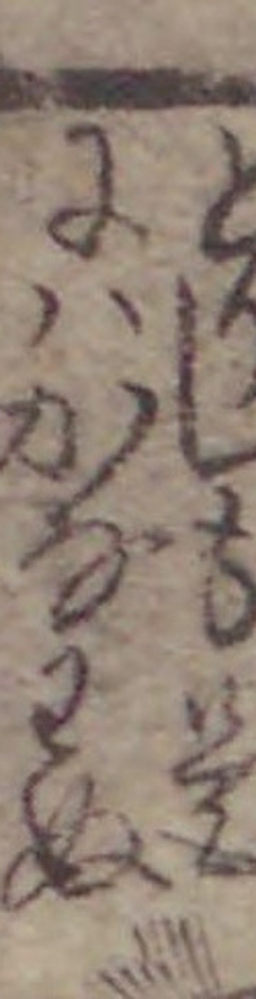にはかなわぬ
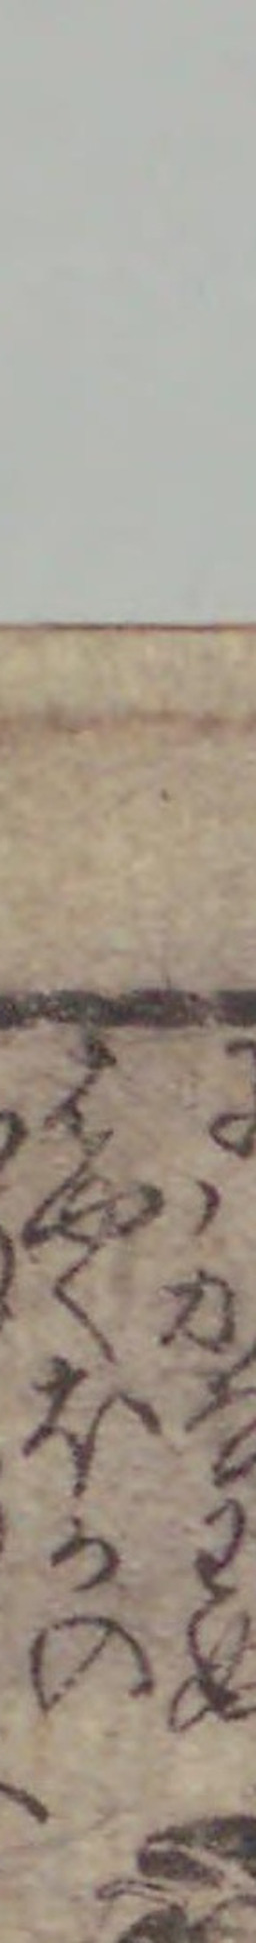はやくほかの
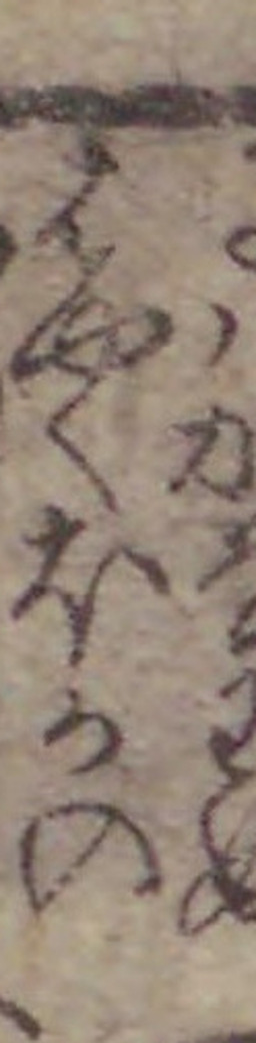はやくほかの
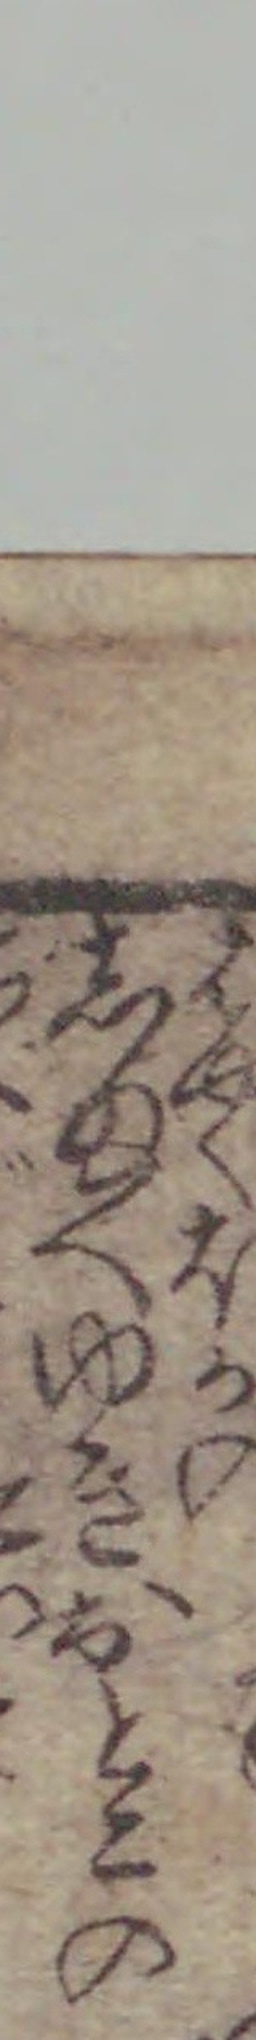しまへゆきおとこの
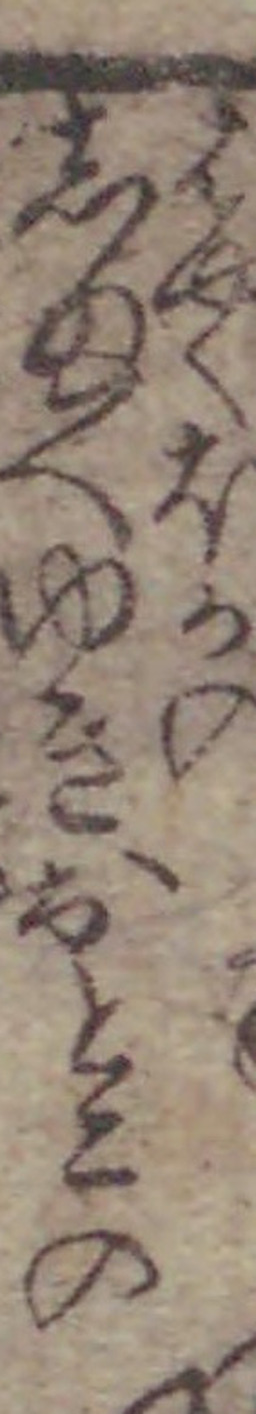しまへゆきおとこの
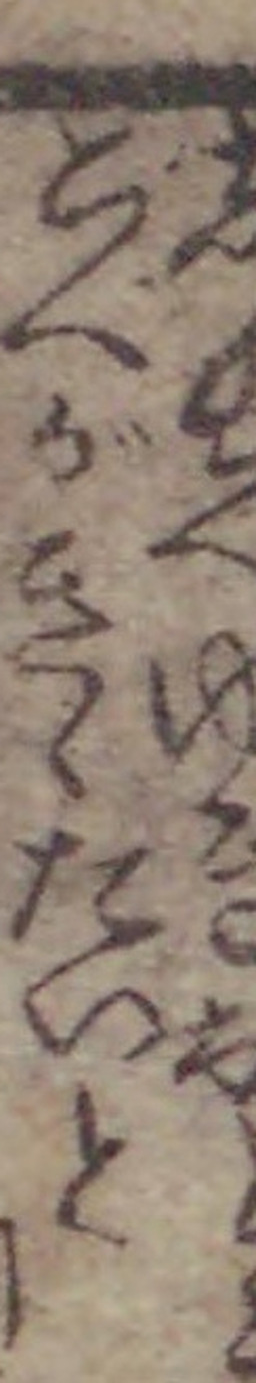こへがきゝたいと

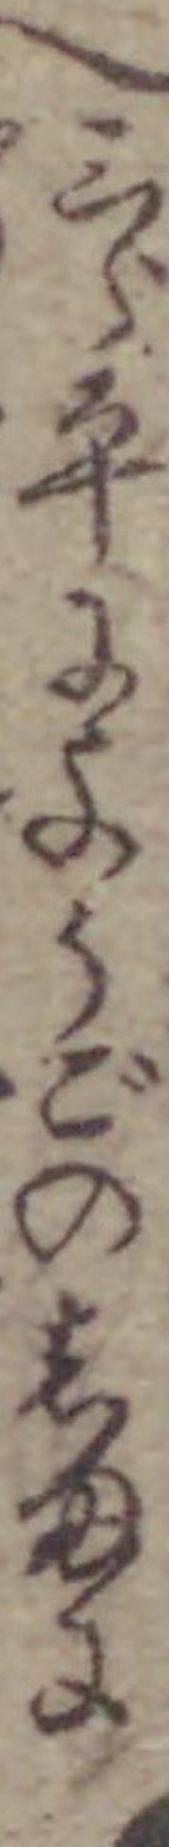三郎平にようごのしまに
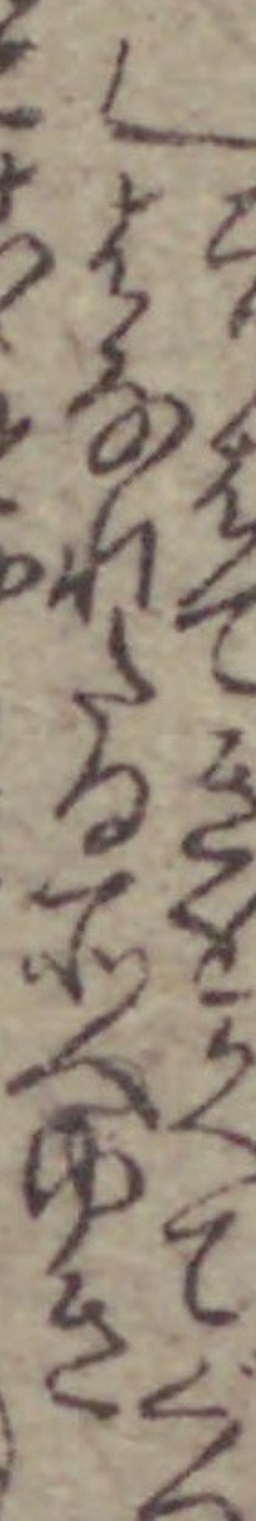はなれたる所へゆき
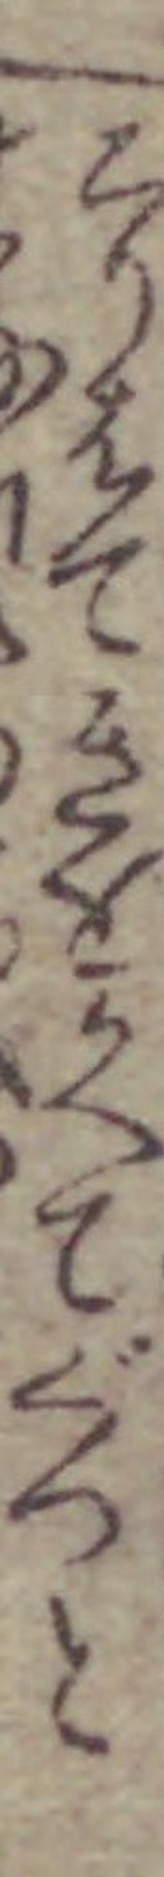こりはてきをかへてぐつと
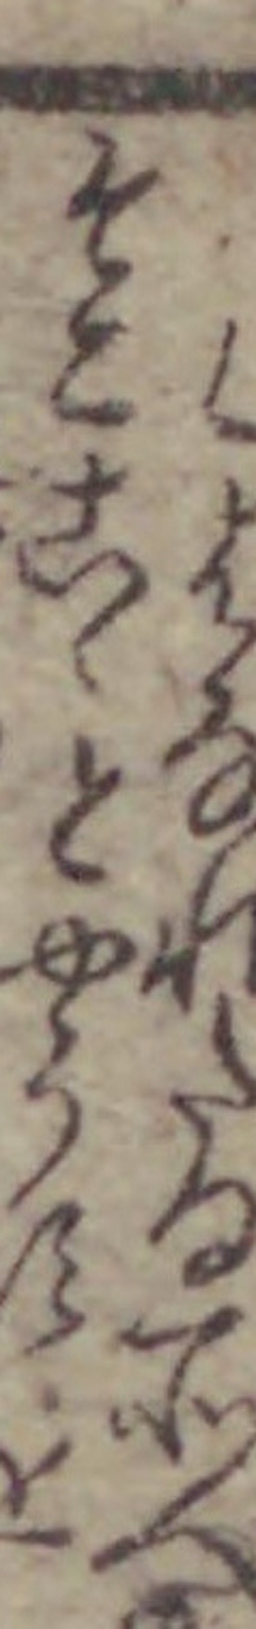そここゝとやうすを
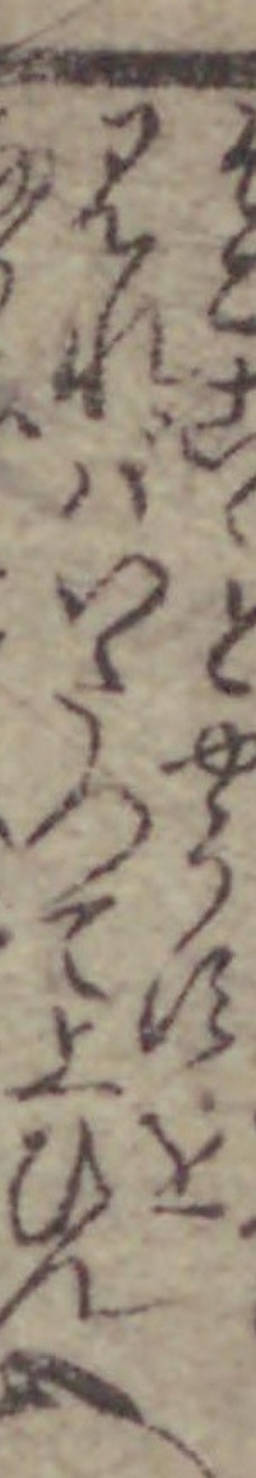見ればいたつて上ひん
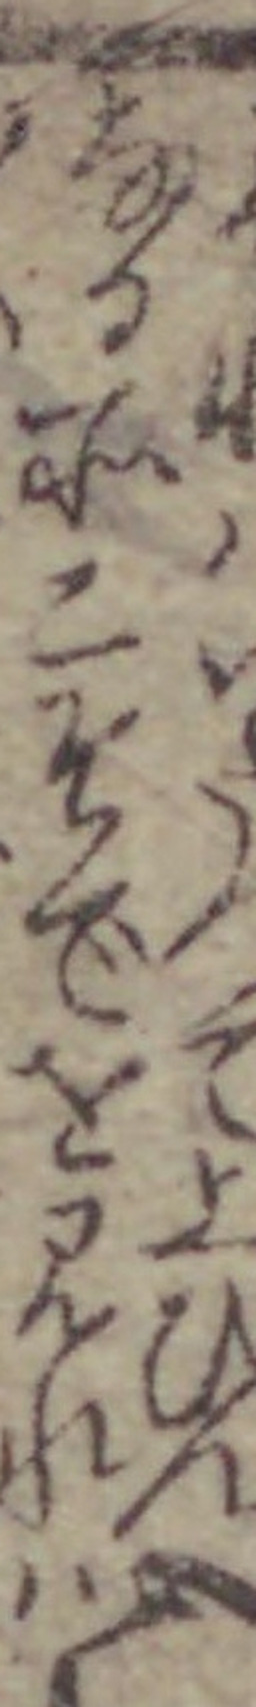なる所こそでを見れは
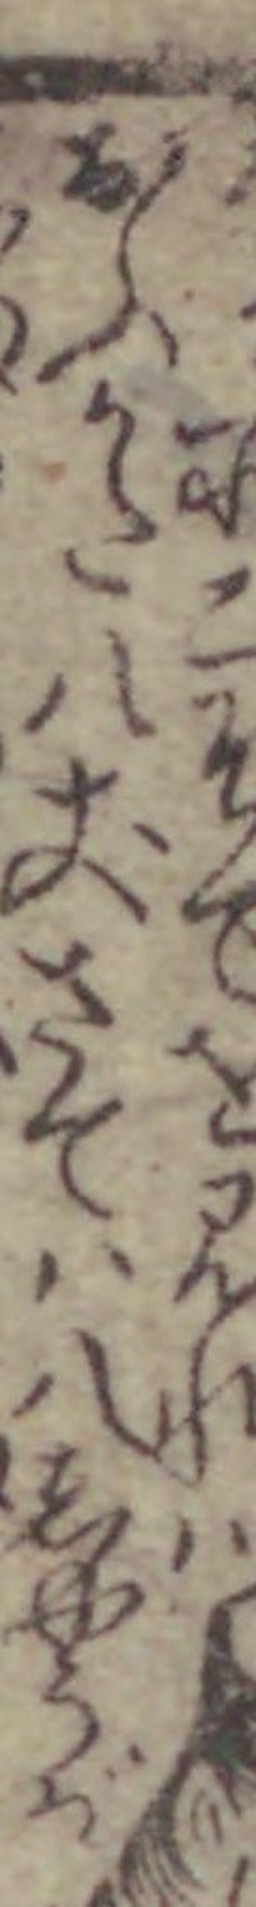おふかた八丈さては八しやうが
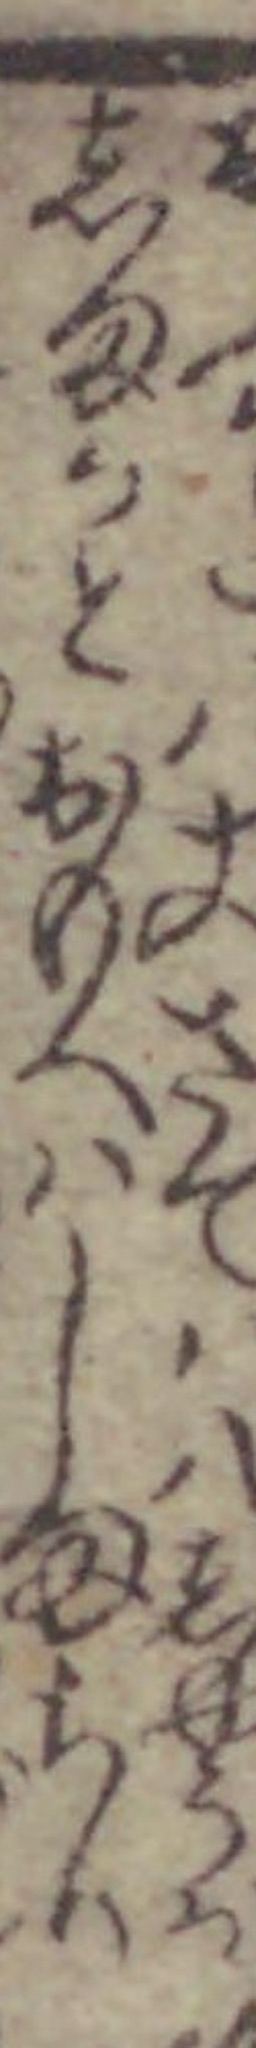しまかとおもへはしまちり
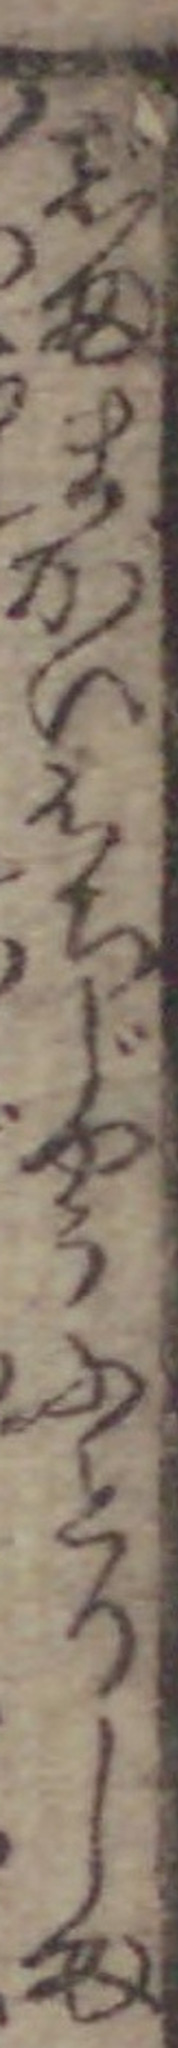じままがいはちじやうふとりしま
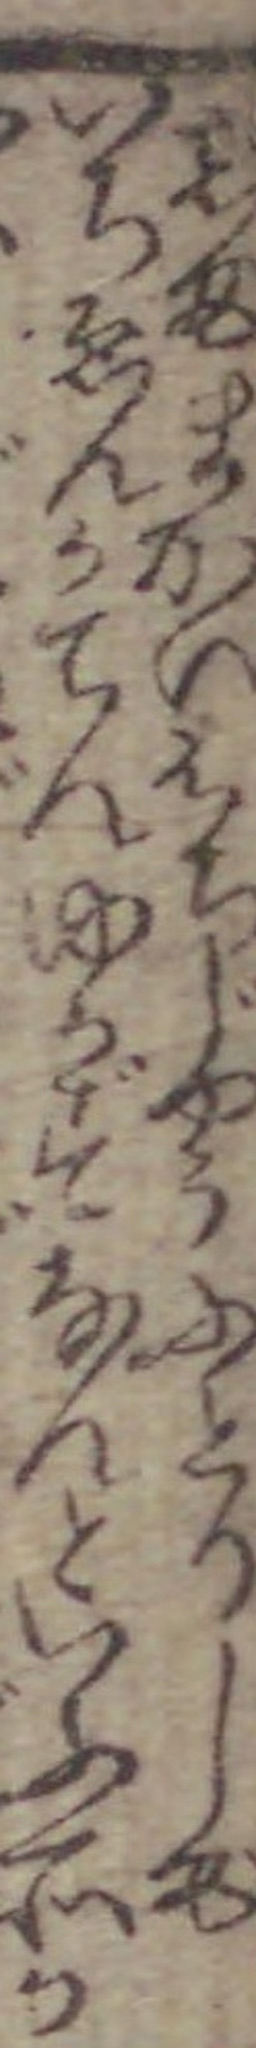いちゑんかてんゆかずなんといふ所か
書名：近頃嶋めぐり 3巻
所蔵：国立国会図書館 National Diet Library, JAPAN
